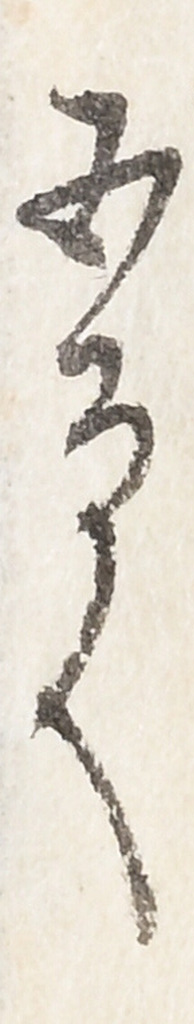六百文
